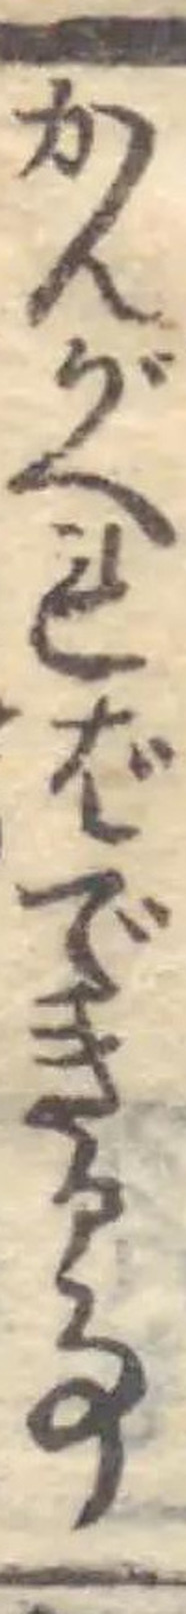かんがへればできる事
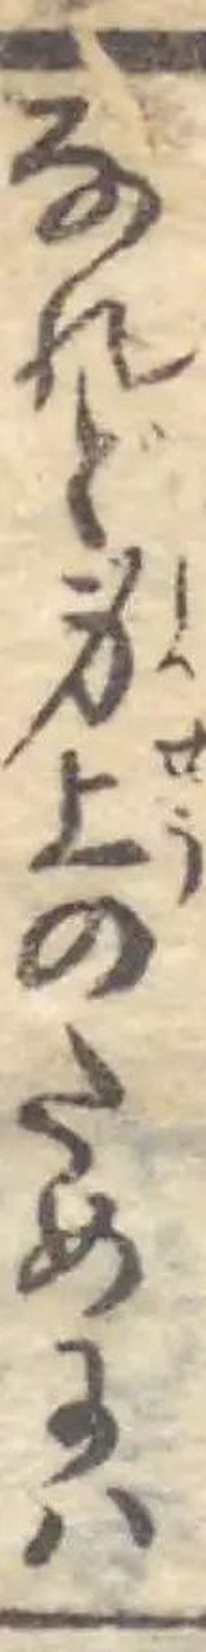なれと身上のためには
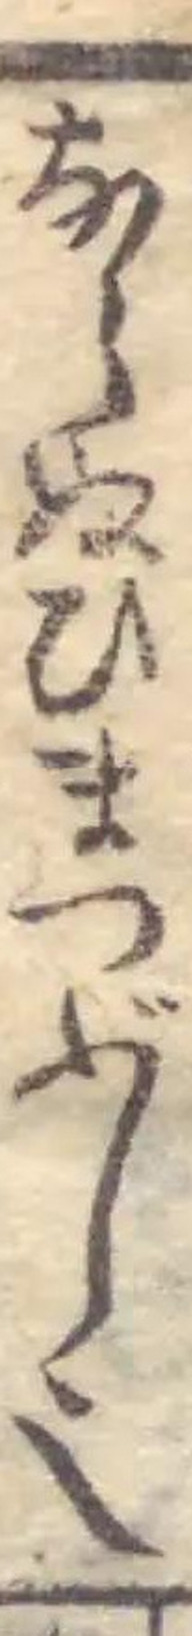ならぬひまつぶし也
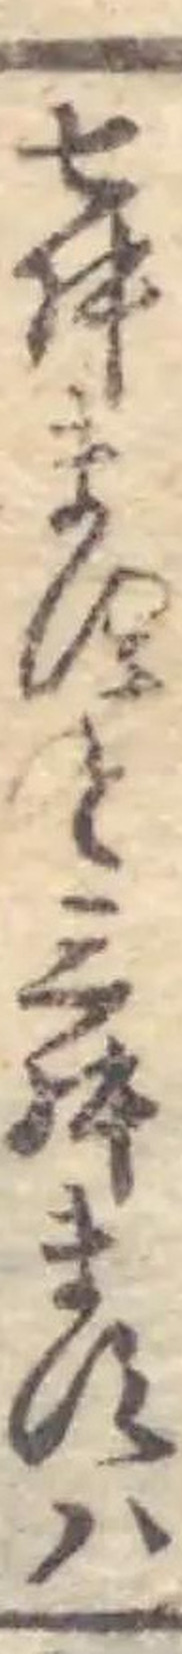七升ますと三升ますは
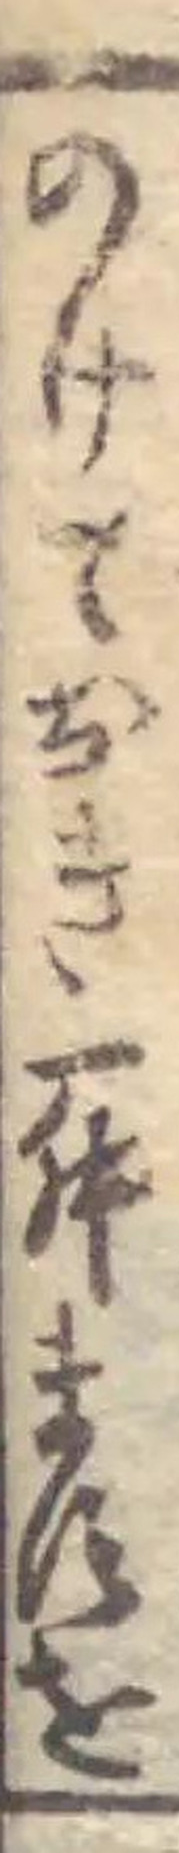のけておき一升ますを
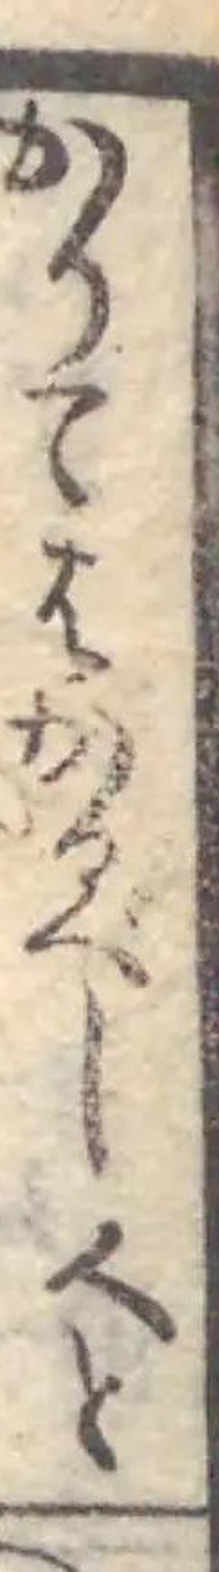かりてはかるべし人と
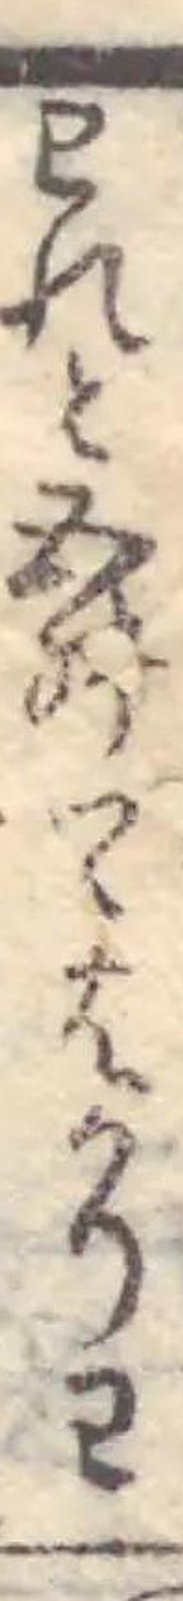われと五升つゝはかりわ
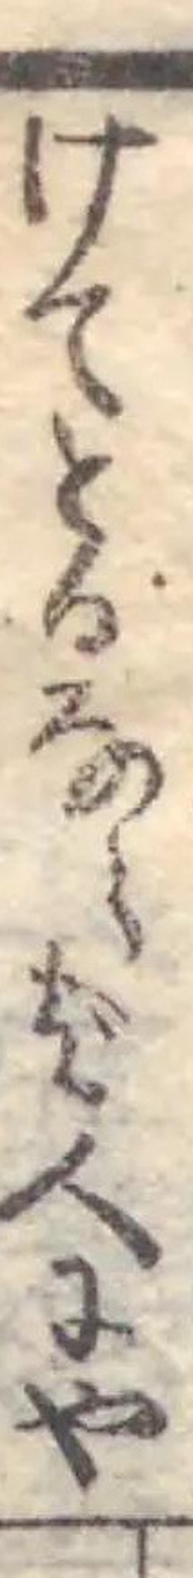けてとるならば人にや
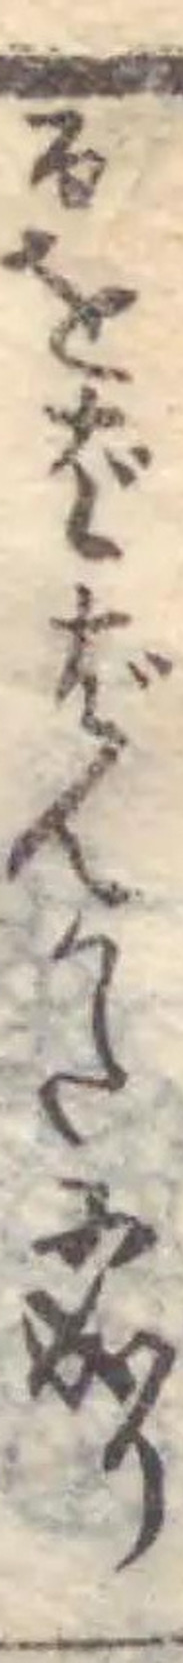るをばばんかたに成り
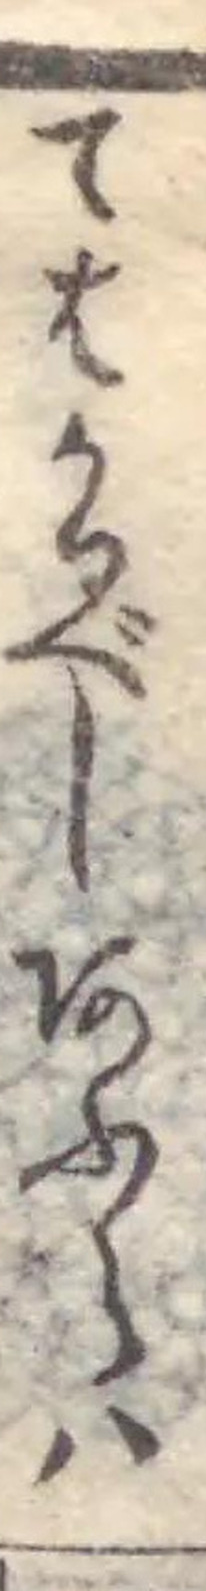てはかるべしあふらは
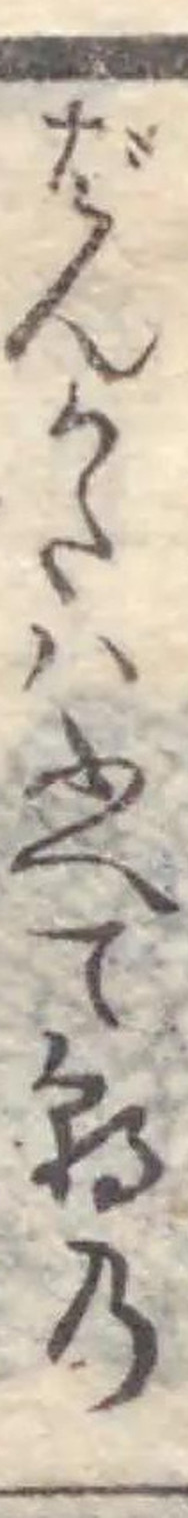ばんかたはふへて朝の
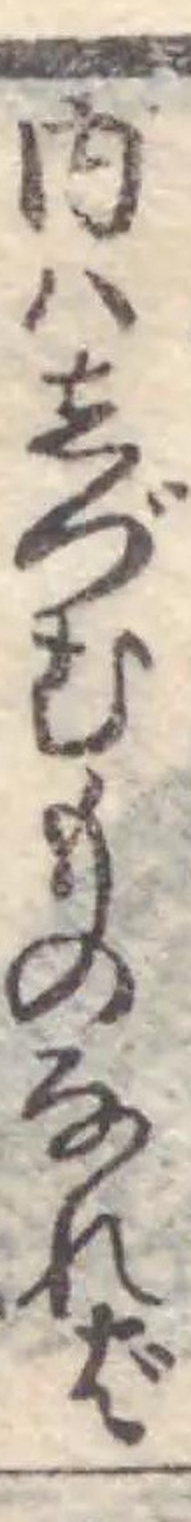内はしづむものなれば
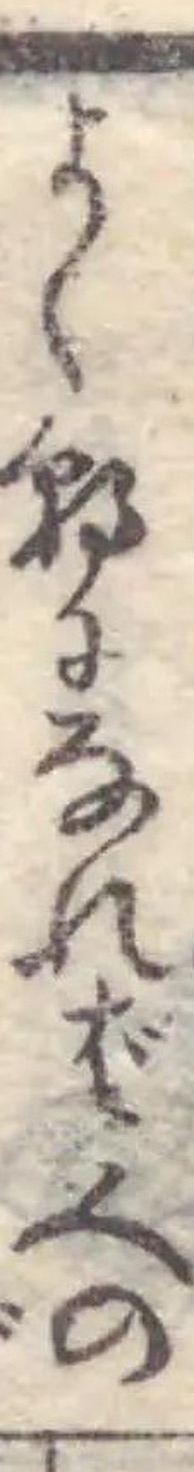よく朝になれば人の
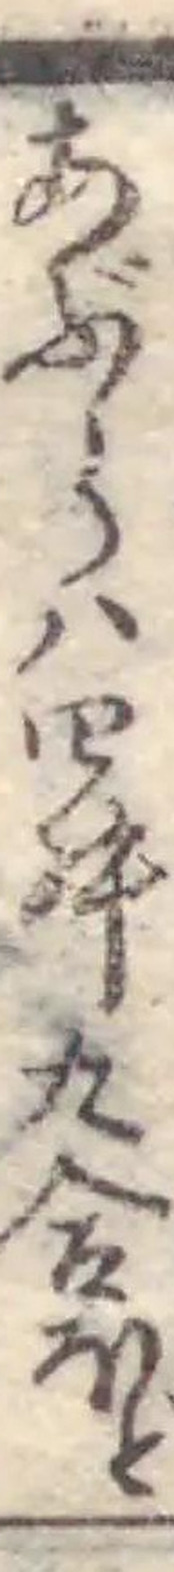あぶらは四升九合ほど
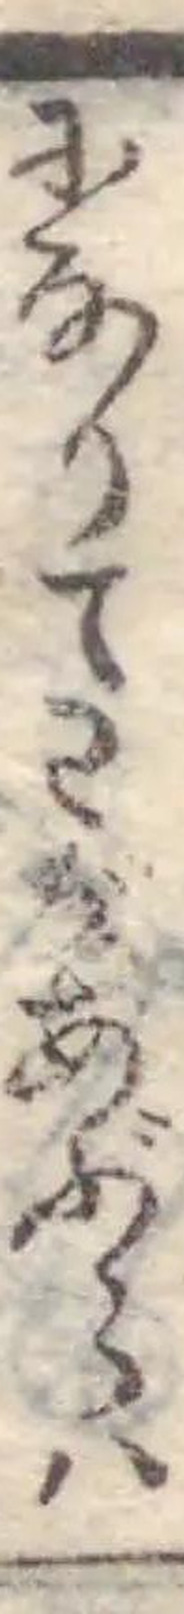になりてわがあぶらは
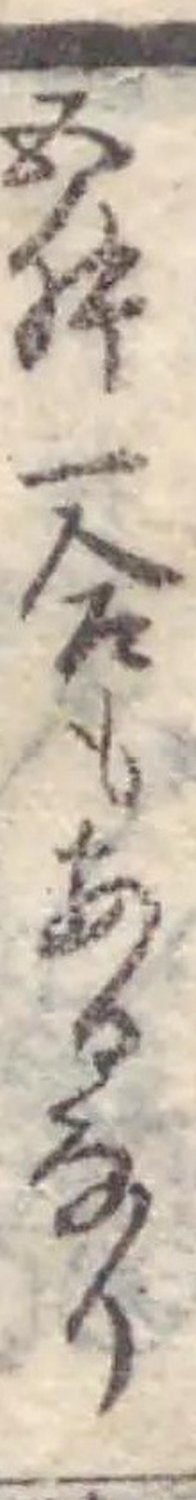五升一合もあるなり
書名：大通人好記
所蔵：国立国会図書館 National Diet Library, JAPAN
